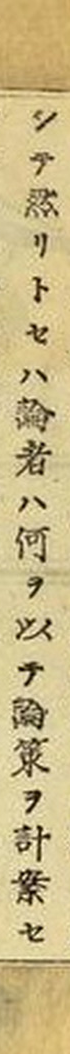シテ然リトセハ論者ハ何ヲ以テ論策ヲ計案セ
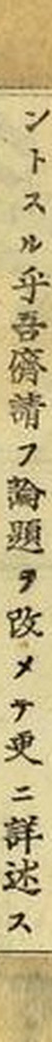ントスル乎吾儕請フ論題ヲ改メテ更ニ詳述ス
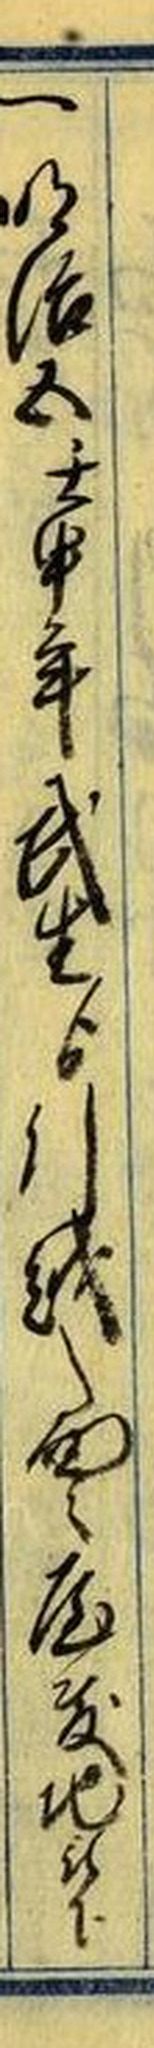一明治五壬申年武生ゟ引越之面々屋敷地被下
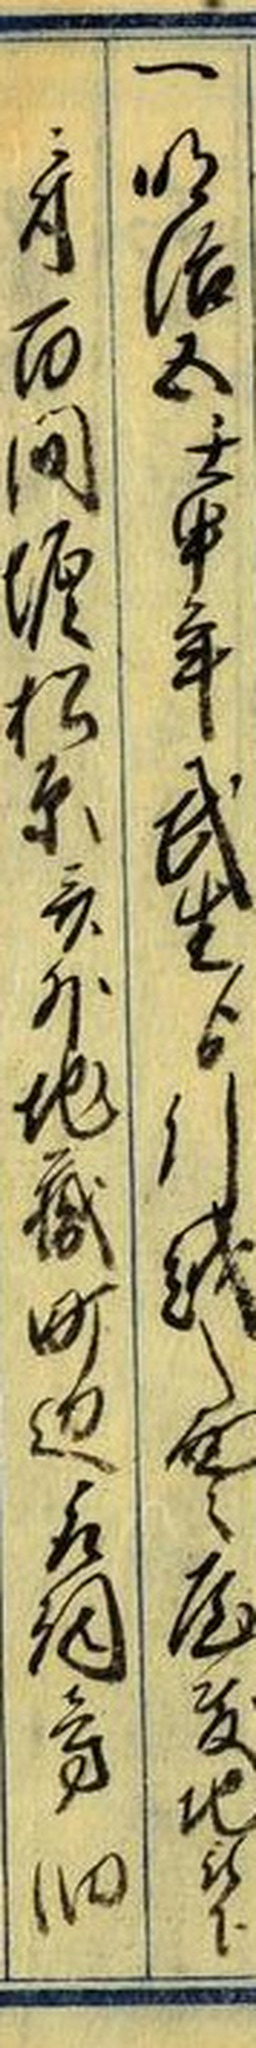ニ付百間堀松原并外地蔵町辺取調旁旧
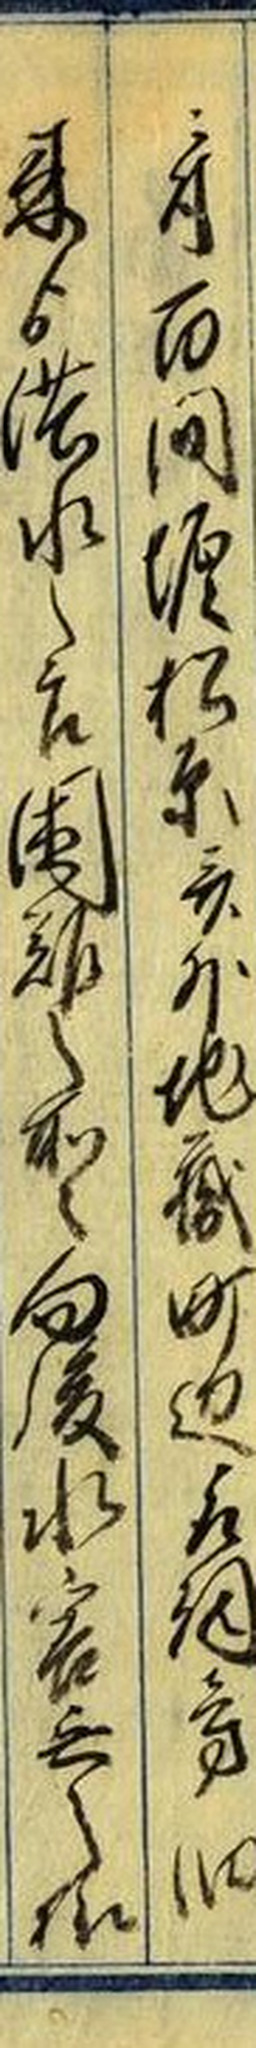来ゟ洪水之節困難之所々向後水害無之様
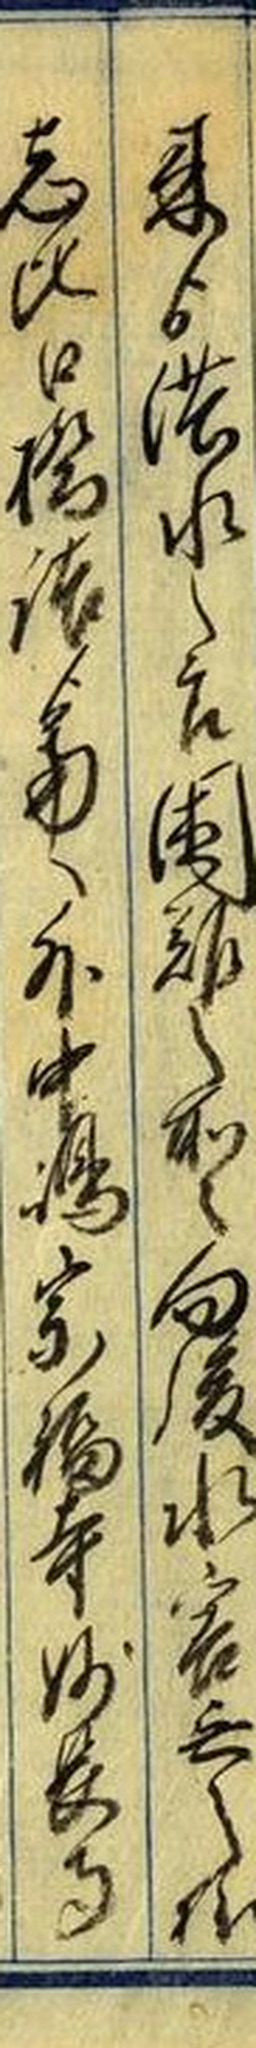志比口橋詰ゟ南之外中嶋宗福寺妙長寺
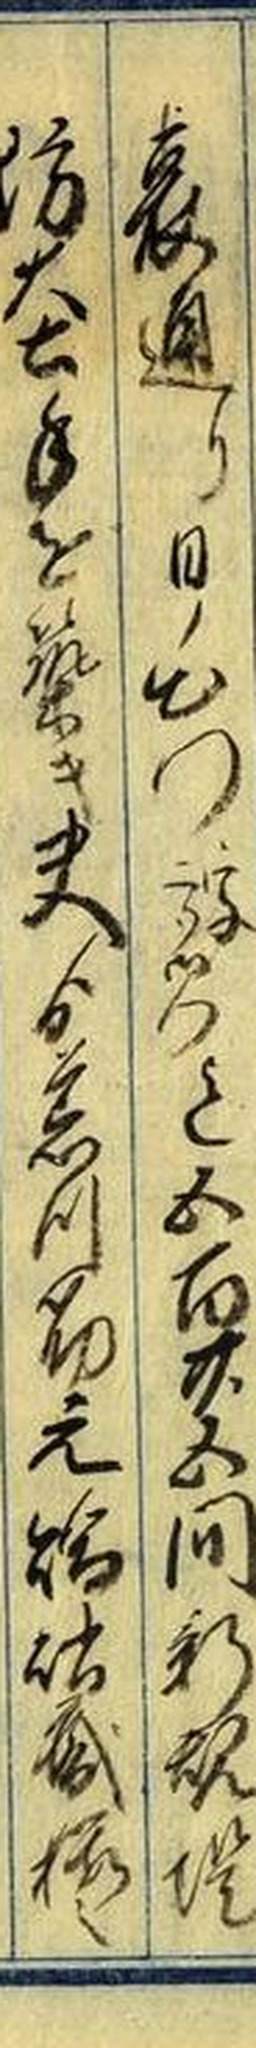防大土手を築キ夫ゟ荒川筋元焔硝蔵桜之
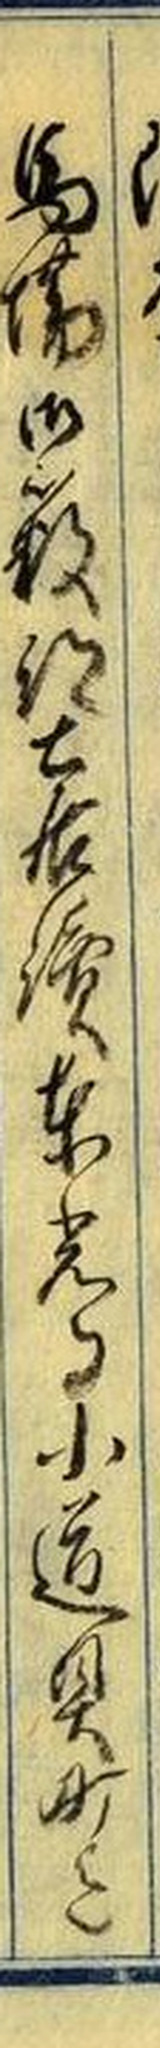馬場御藪跡土居續本光寺小道具町迄
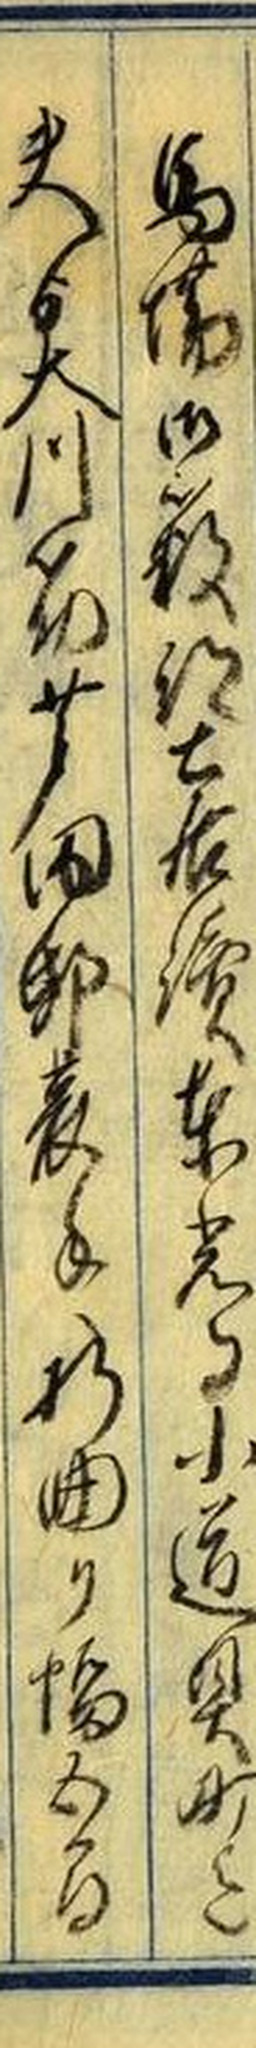夫ゟ大川筋芦田邸表手折曲り幅五間
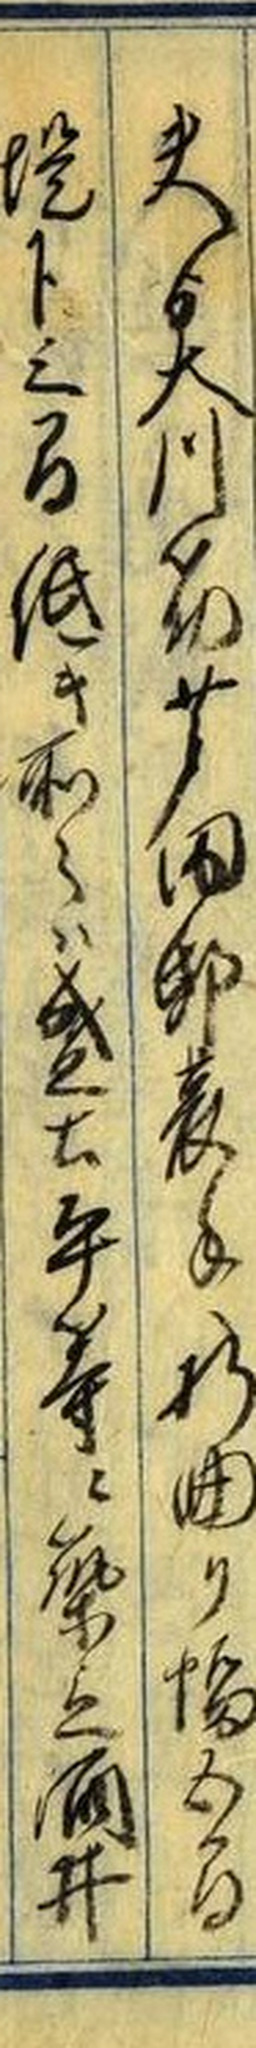堤下三間低キ所々ハ盛土平等ニ築立酒井

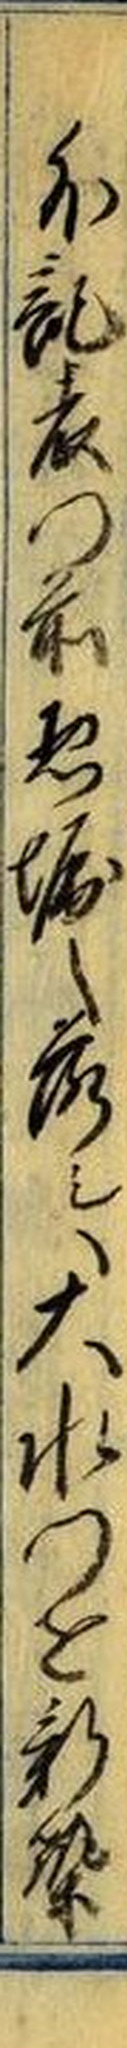外記表御門前惣堀の落シへ大水門を新築
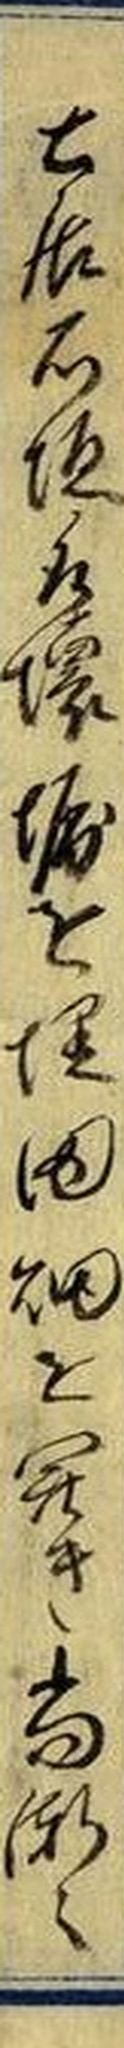土居石垣取壊堀を埋田畑を開き尚漸々
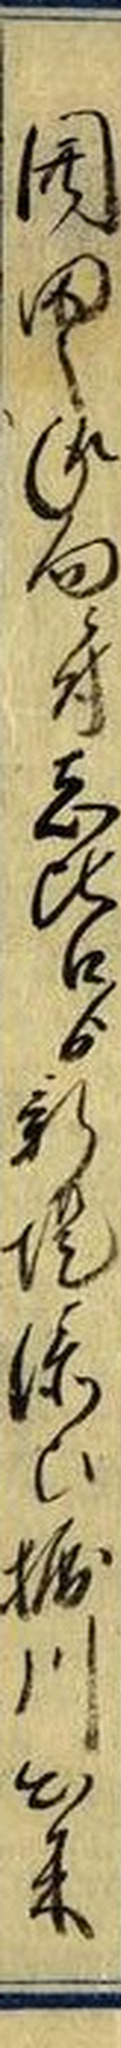開田之趣向二付志比口ゟ新堤添ひ堀川出来
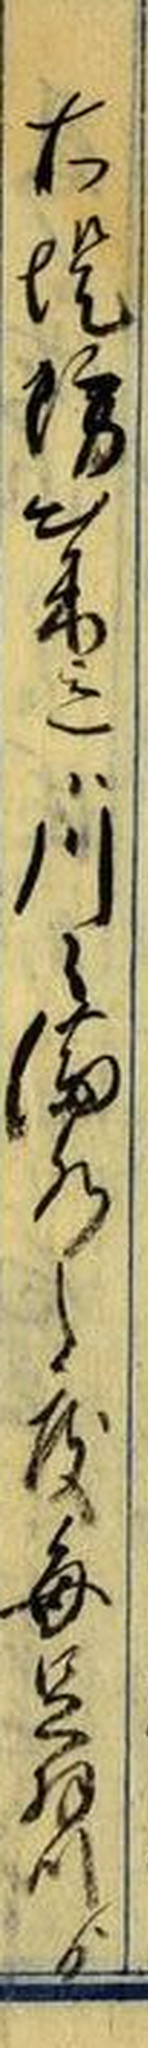大堤防出来迄ハ川之満水之度毎足羽川ゟ
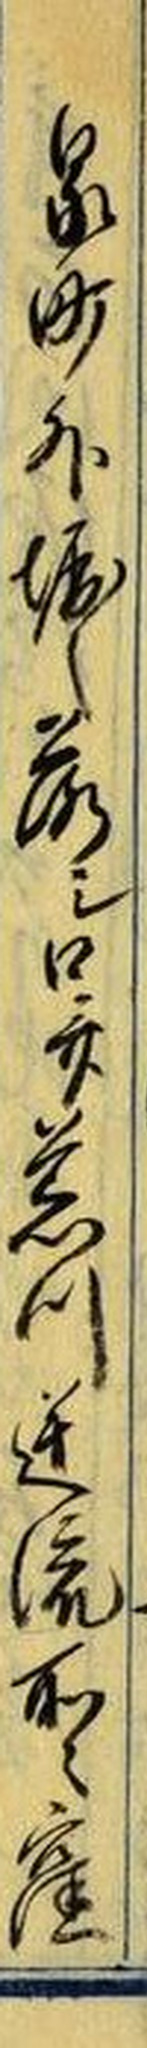泉町外堀之落シ口并荒川逆流所々窪
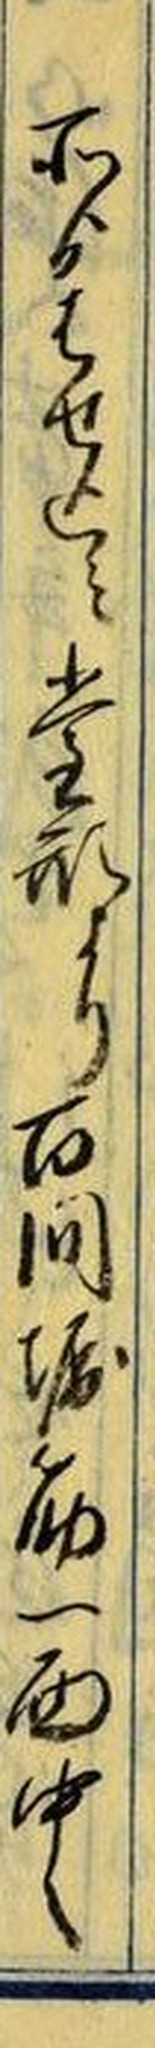所ゟはせ込ミ堂形より百間堀筋一面中之
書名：温古集 五巻
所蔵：福井県文書館 Fukui Prefectural Archives
